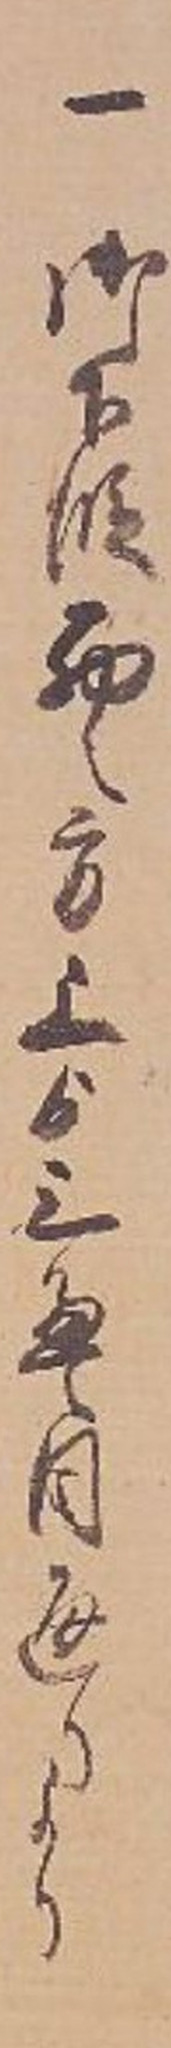一御下段西之方上ゟ三畳目通りより
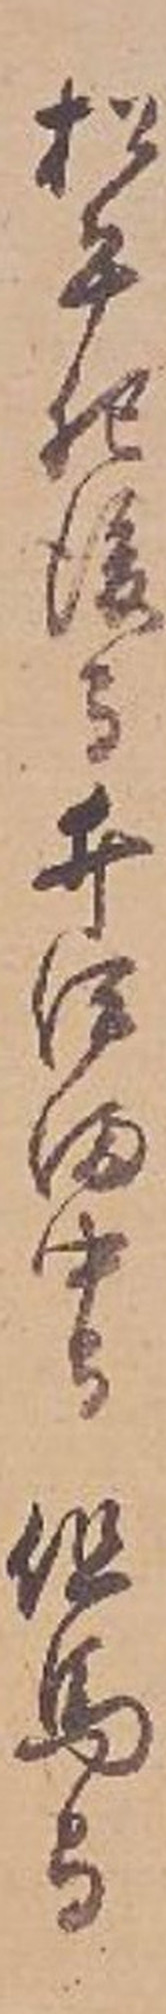松平肥後守井伊備中守但馬守
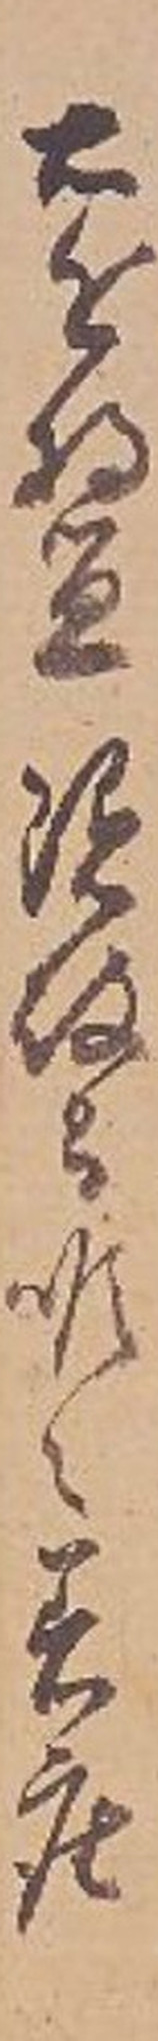右近将監隠岐守順々着座
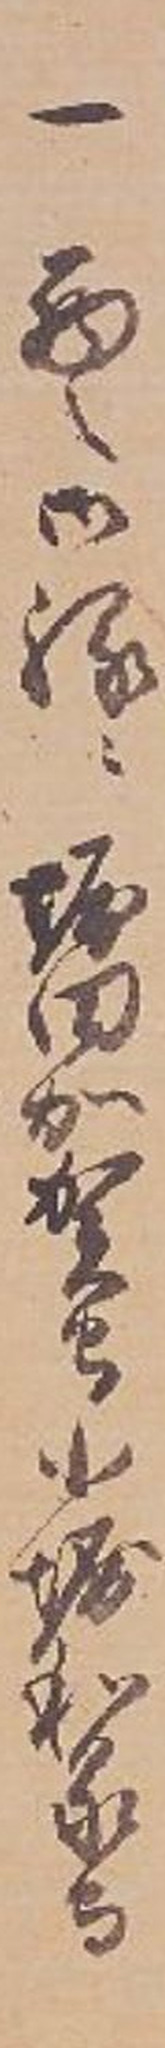一西之御縁に堀田加賀守小堀和泉守
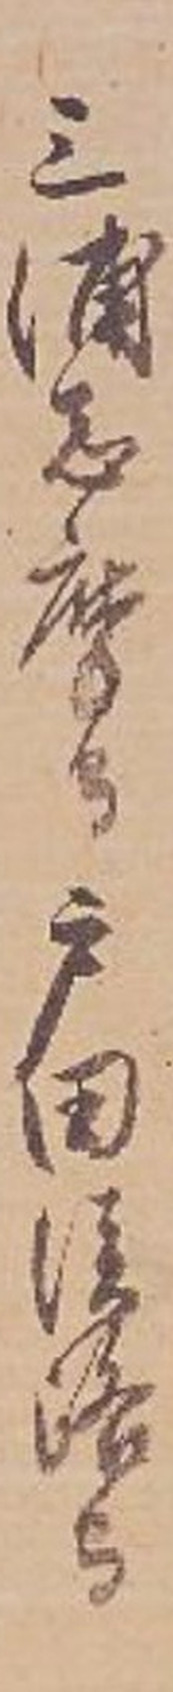三浦志摩守戸田淡路守
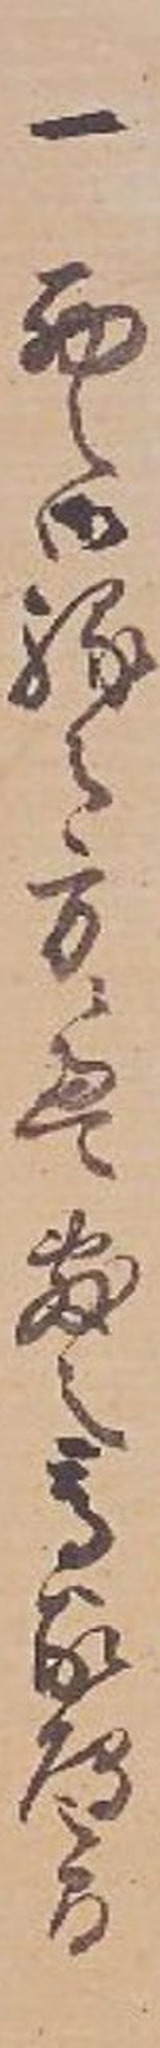一西之縁之方に畳敷之高家雁之間
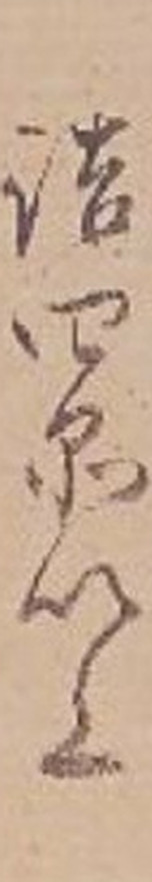詰四品以上
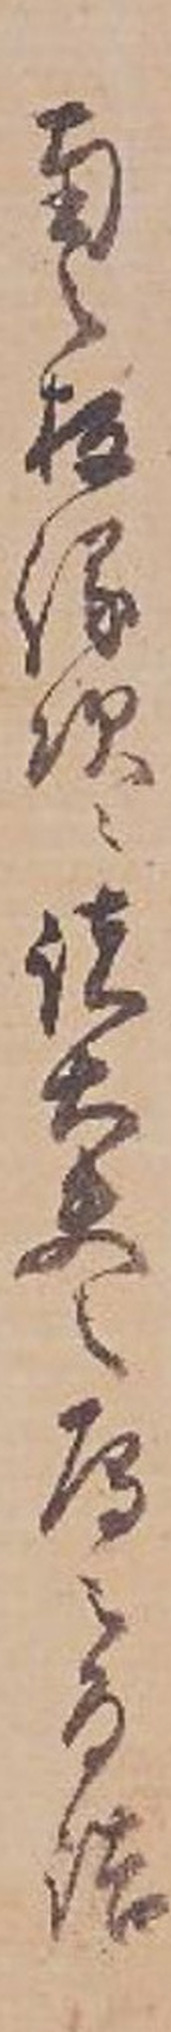一南之板縁次に諸大夫之雁之間詰
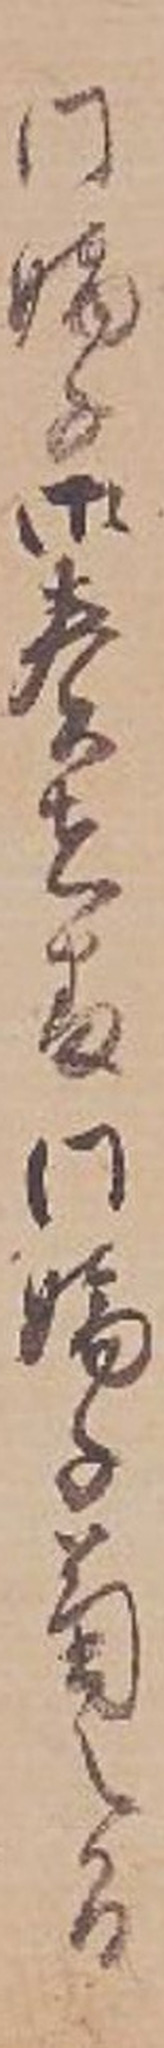同嫡子御奏者番同嫡子菊之間

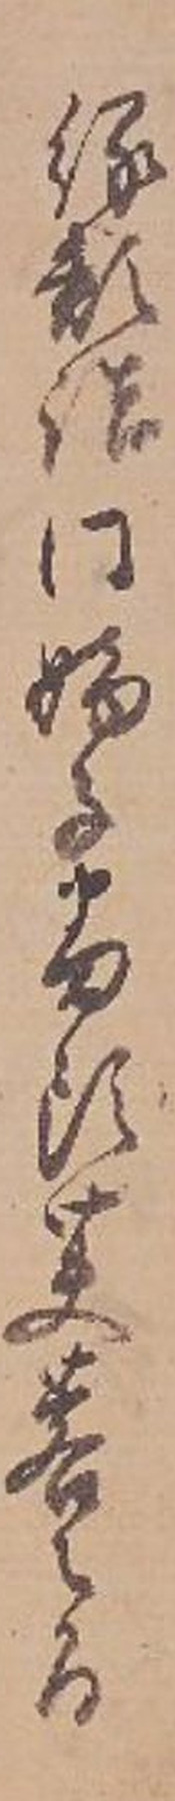縁頬詰同嫡子番頭芙蓉之間
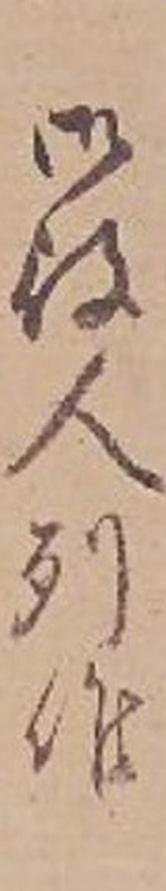御役人列候
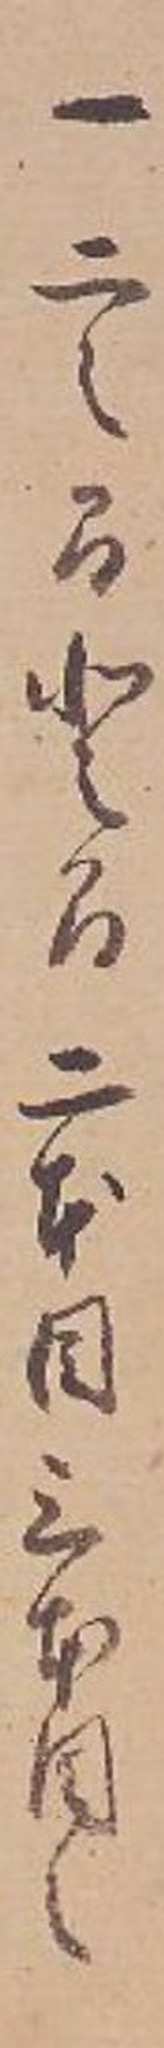一二之間北之間二本目三本目之
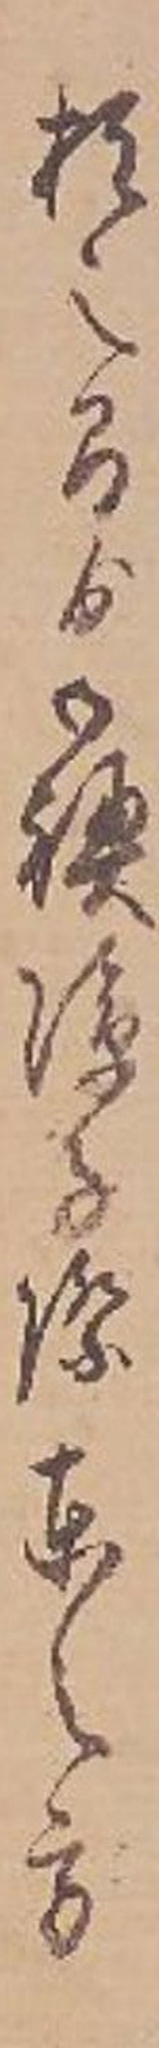柱之間ゟ御襖障子際東之方
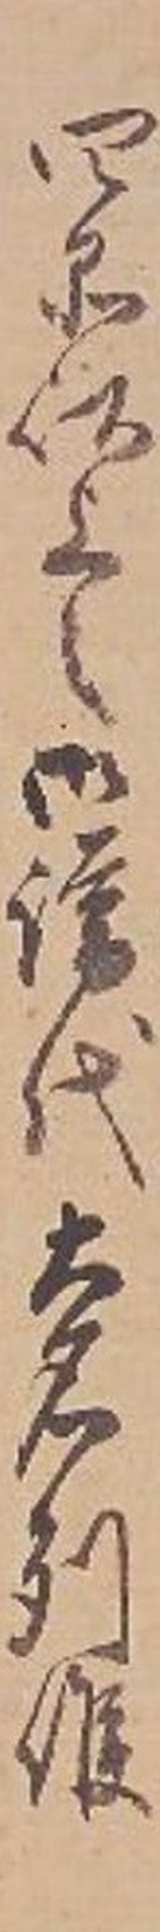四品以上御譜代大名列候
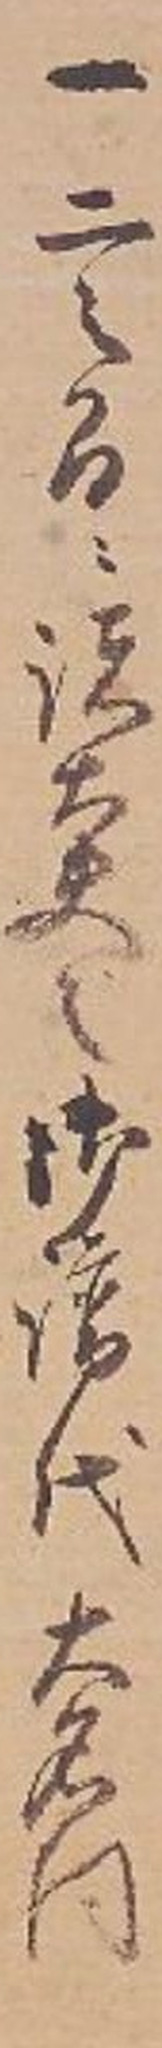一二之間に諸大夫之御譜代大名同
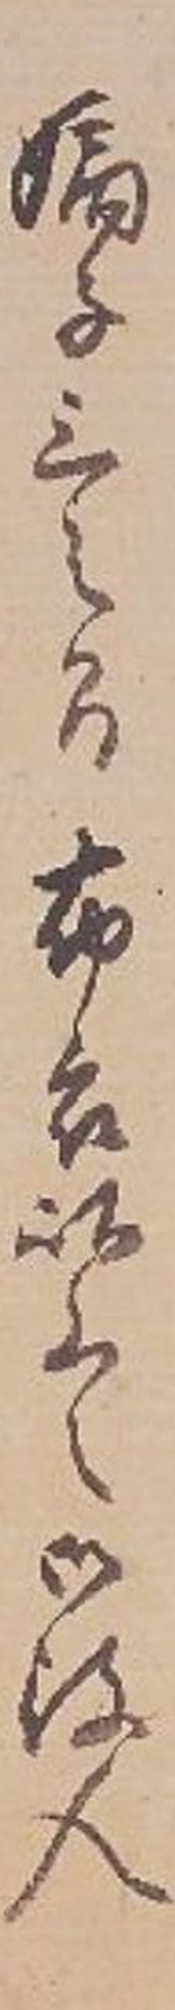嫡子三之間布衣以上之御役人
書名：琉球人来朝記 五、六、七
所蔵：University of the Ryukyus Library
